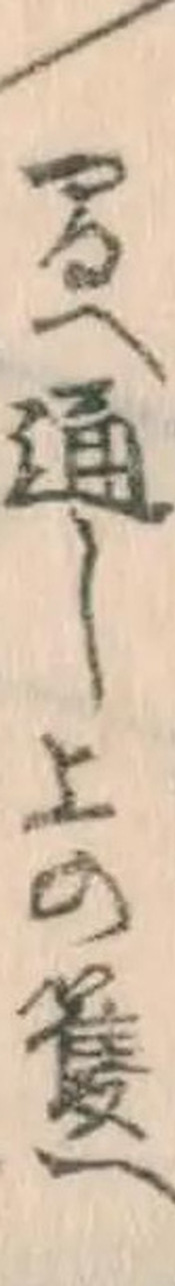間へ通し上の篗へ
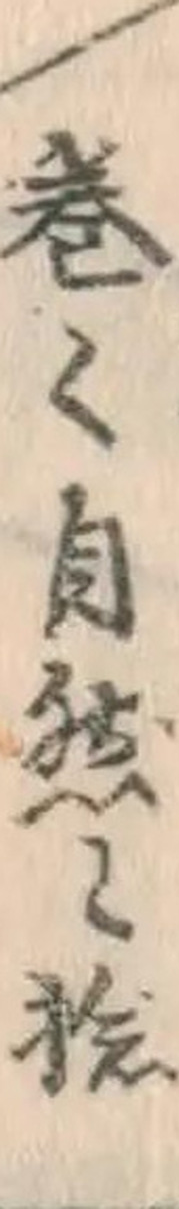巻く自然と捻

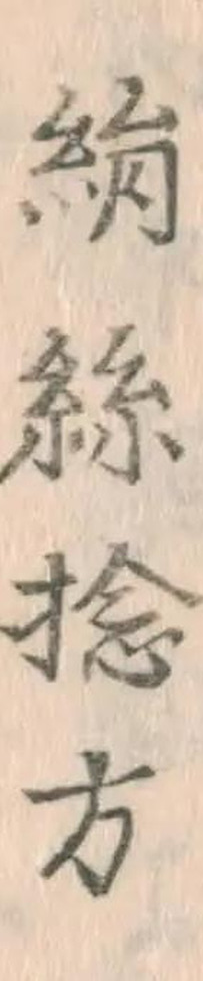絹糸捻方
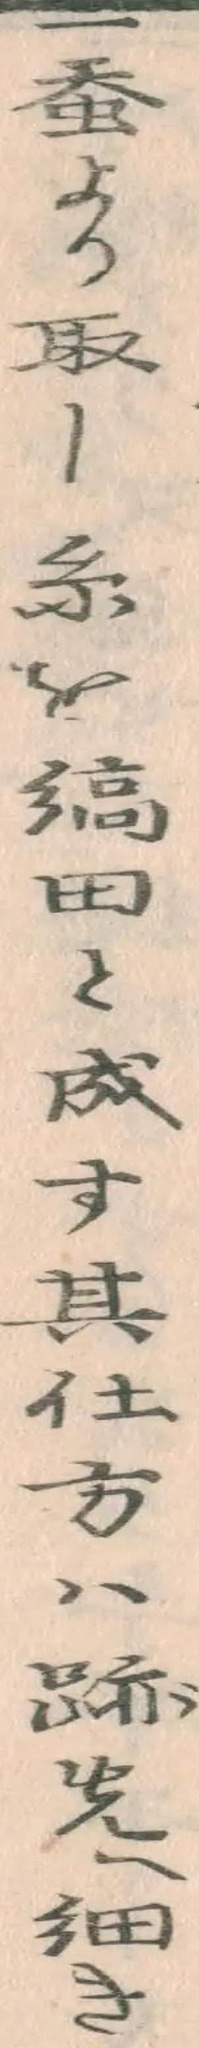一蚕より取し糸を縞田と成す其仕方は跡先へ細き
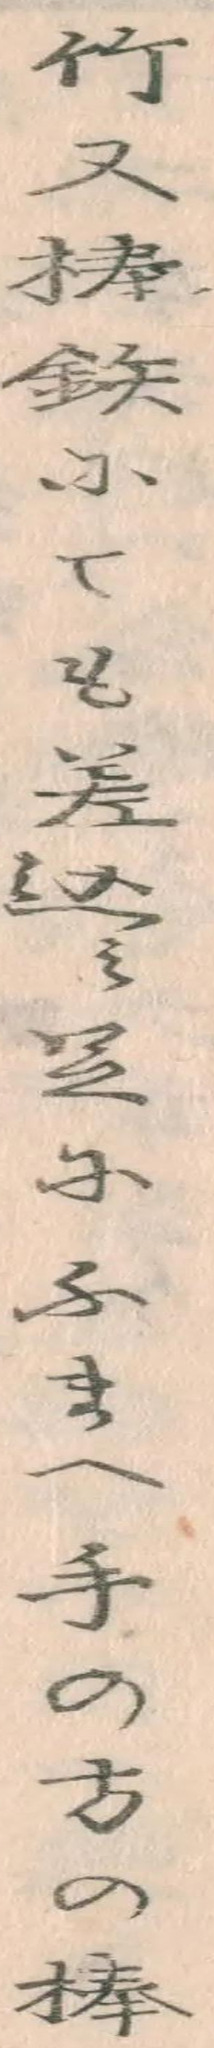竹又棒鉄にても差込み足にふまへ手の方の棒
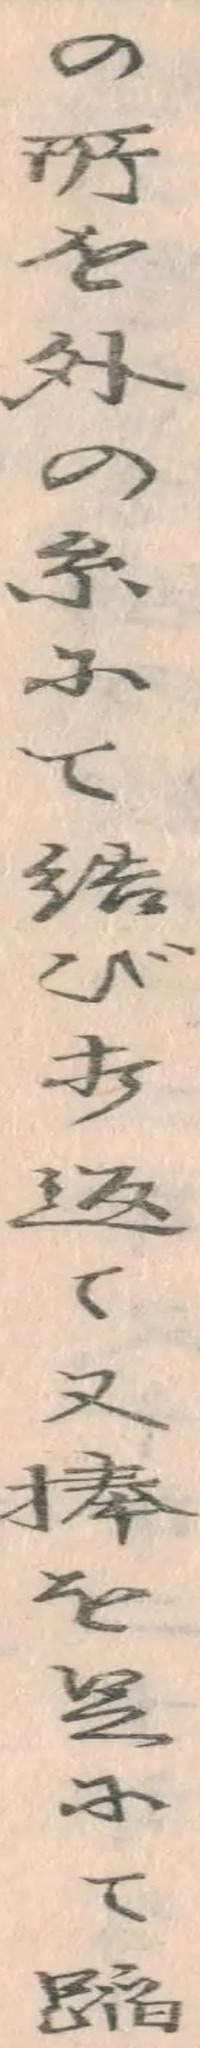の所を外の糸にて結び打返て又棒を足にて蹈
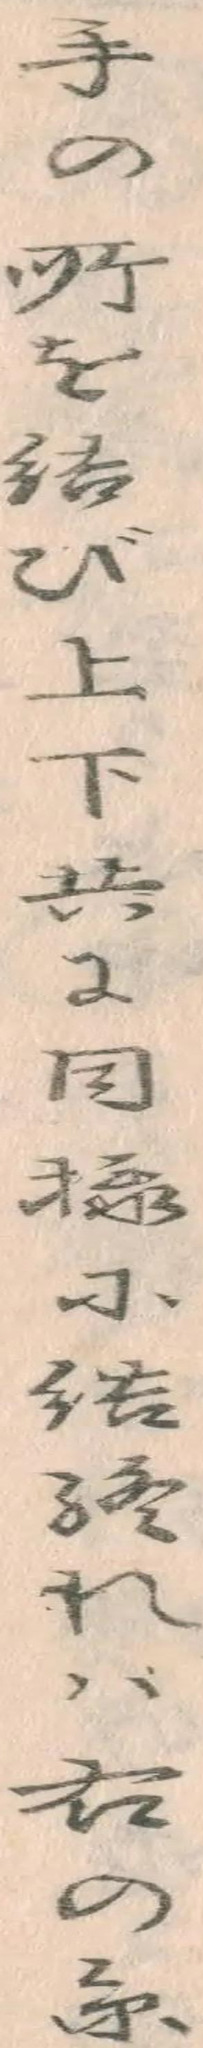手の所を結び上下共に同様に結終れは右の糸
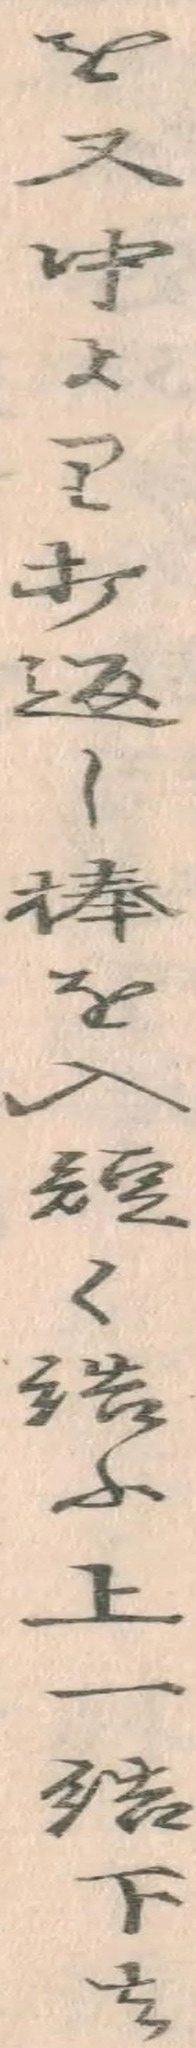を又中より打返し棒を入短く結ふ上一結下は
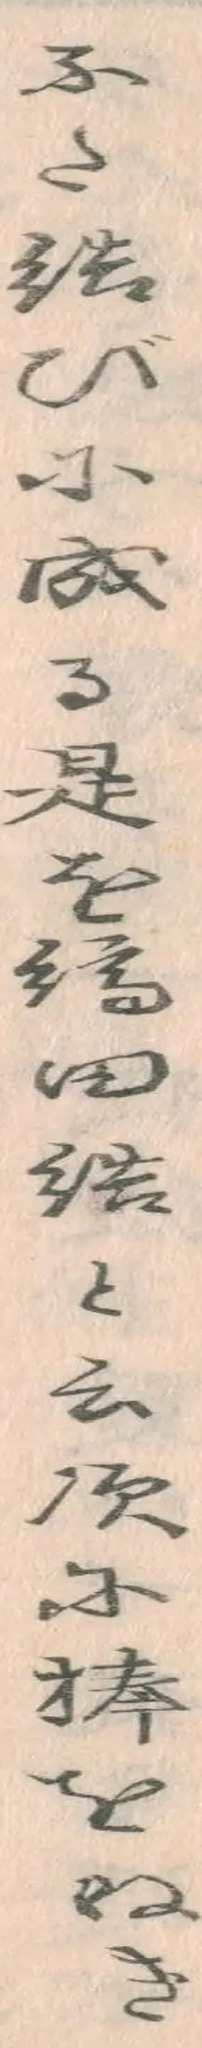ふた結びに成る是を縞田結と云次に棒をぬき
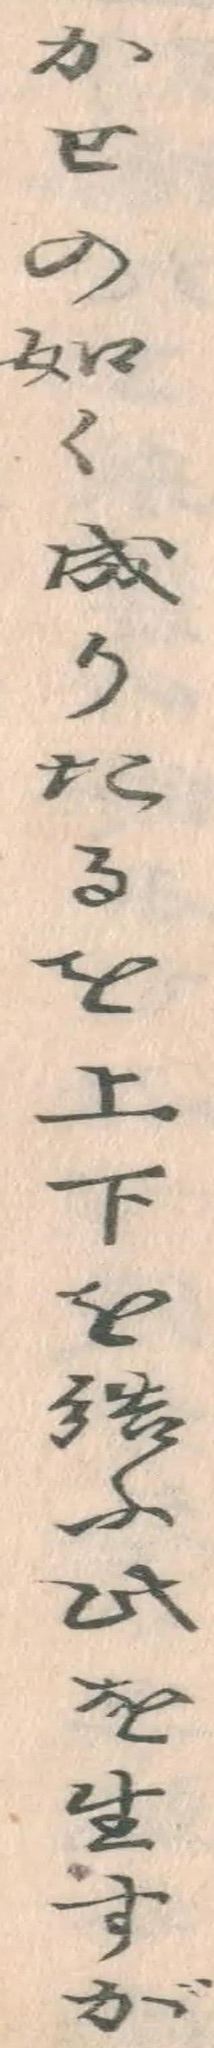かせの如く成りたるを上下を結ふ此を生すが
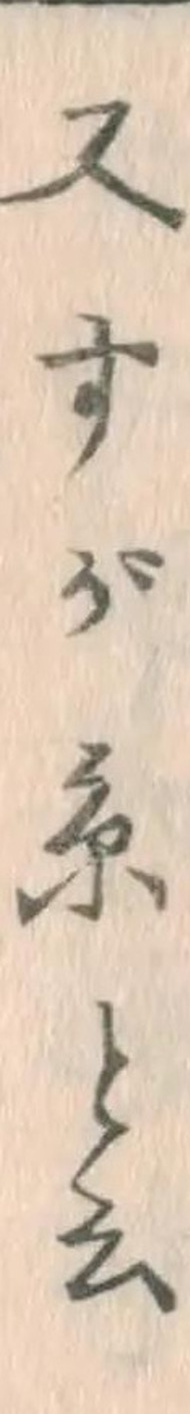又すが糸と云
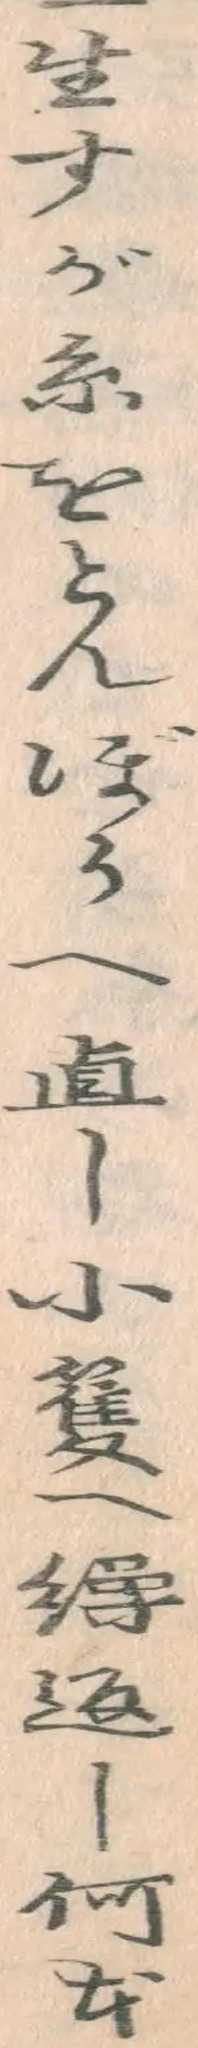一生すが糸をとんぼうへ直し小篗へ繰返し何本
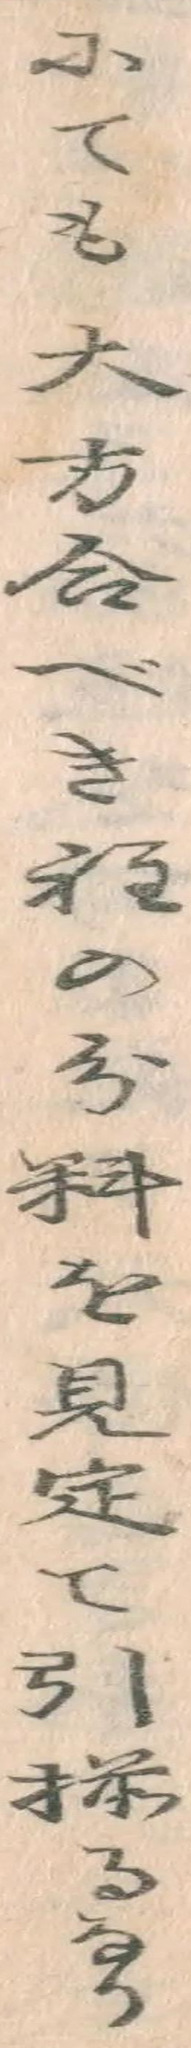にても大方合べき程の分料を見定て引揃るなり
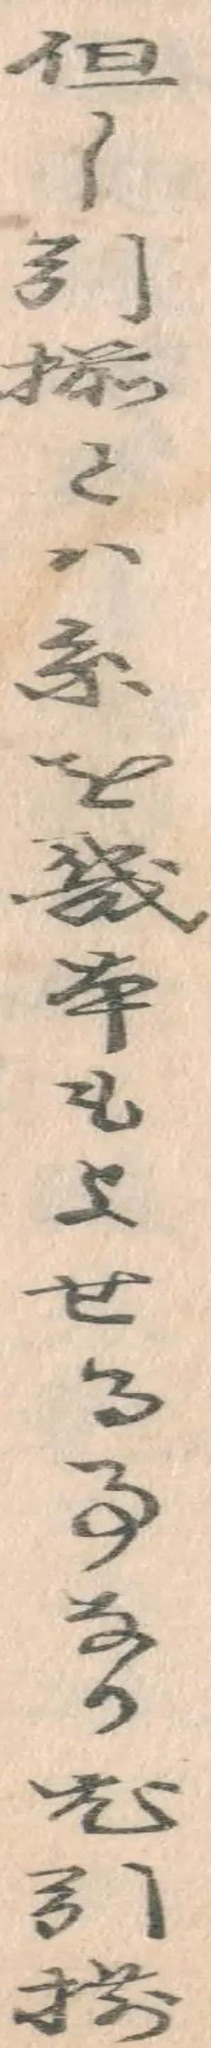但し引揃とは糸を幾本もよせる事なり尤引揃
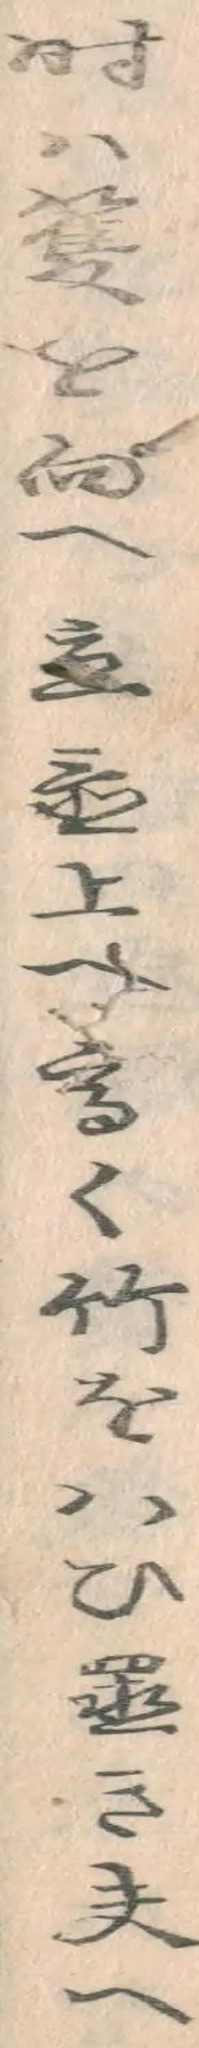時は篗を向へ立置上へ高く竹をはひ置き夫へ

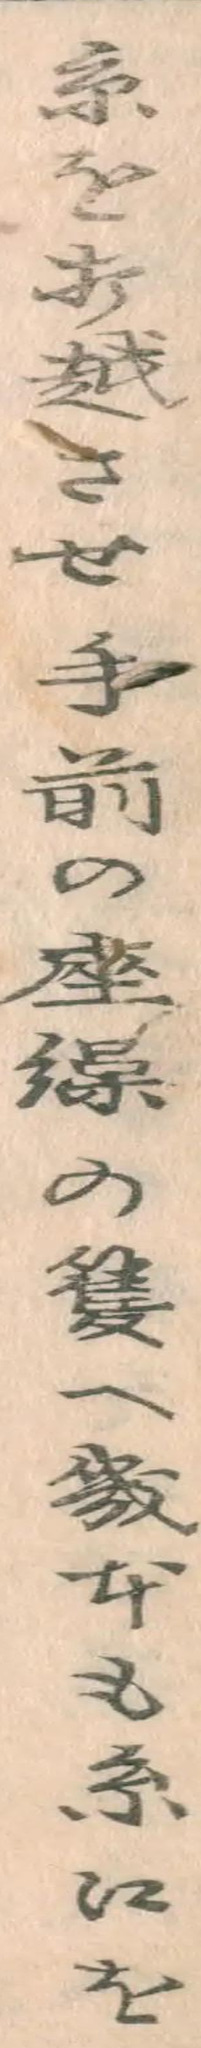糸を打越させ手前の座繰の篗へ幾本も糸口を
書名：機織彙編 5巻. [1]
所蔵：国立国会図書館 National Diet Library, JAPAN
